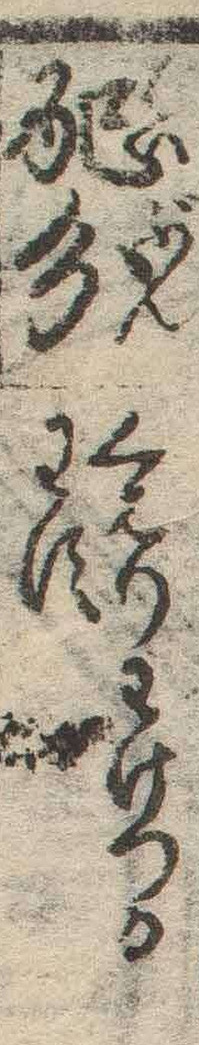配分くはりわける
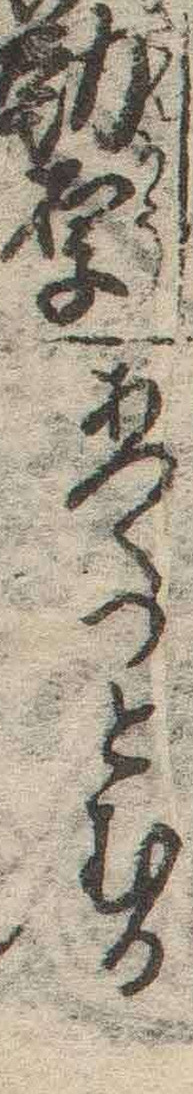勤厚あつくつとむる
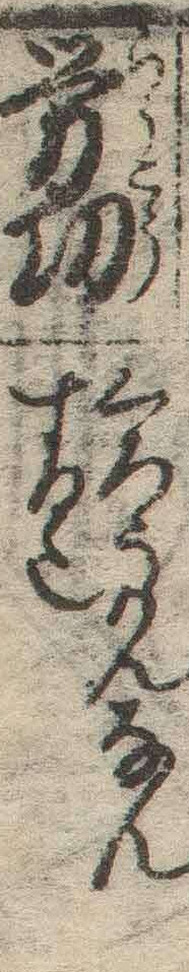労功くろうかんなん
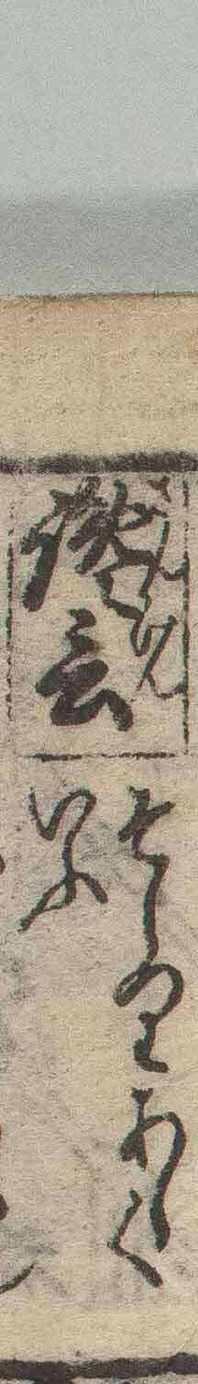讒言そしりあしく

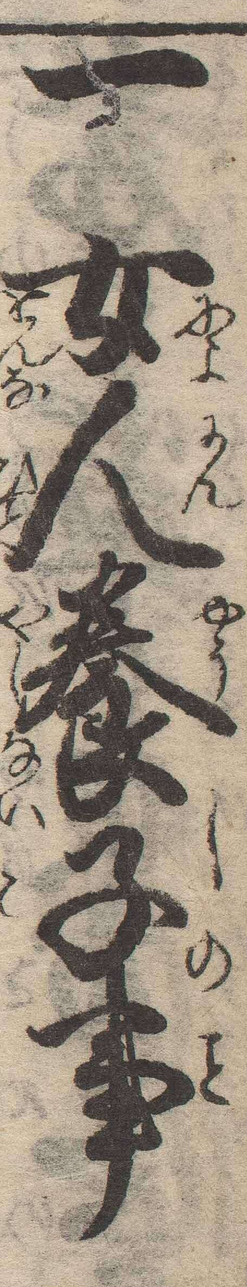一女人養子事
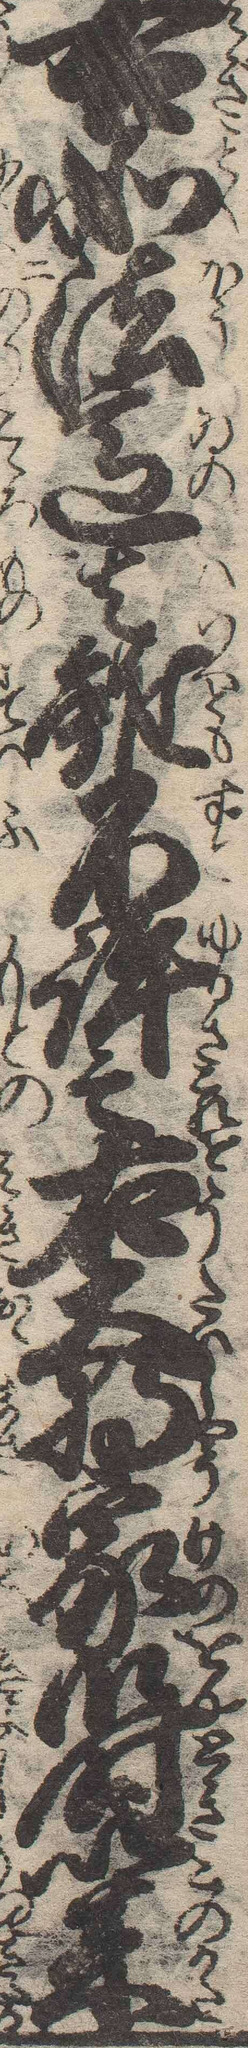右如法意者雖不許之右大将家御時以来
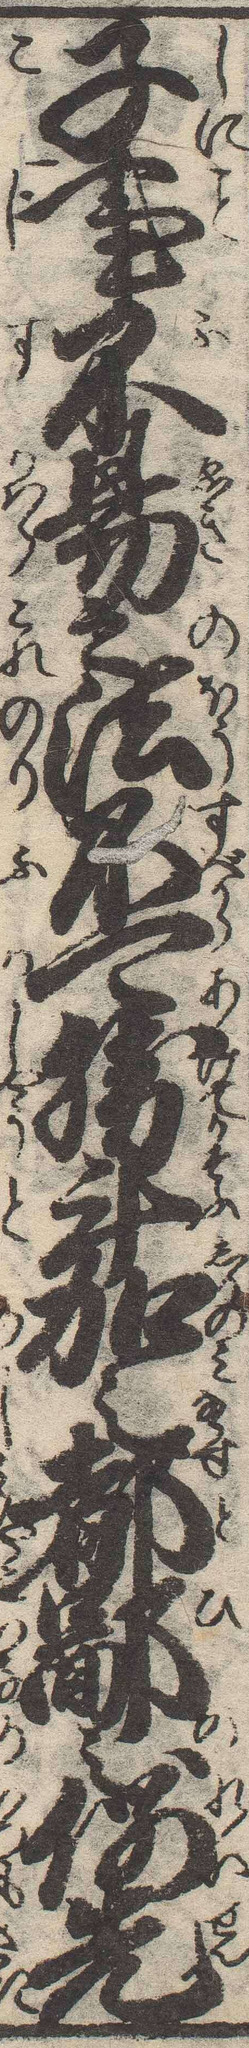子事不易之法不可勝計加之都鄙之例先
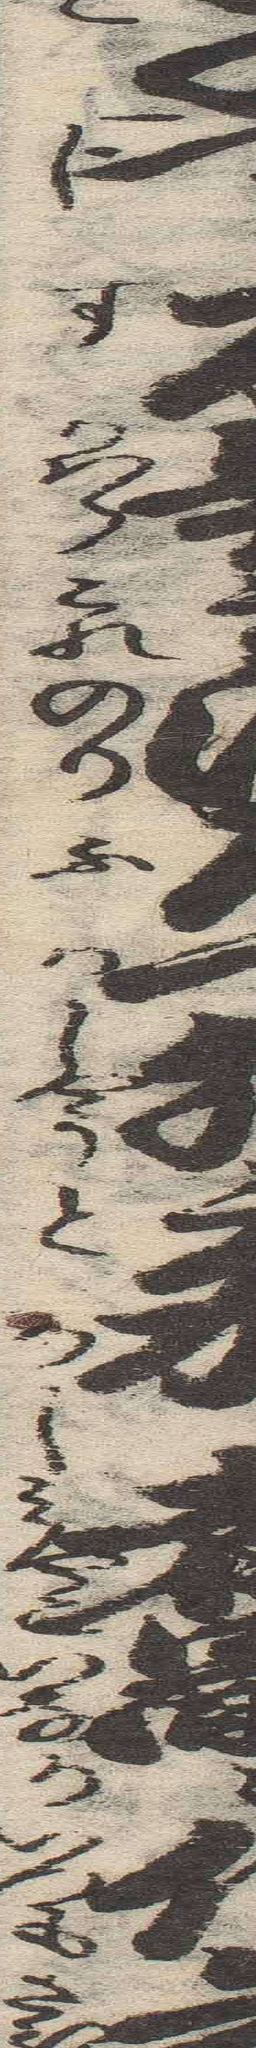こじすかはらこれのりふかしやうとしみやこいなかいつもさき
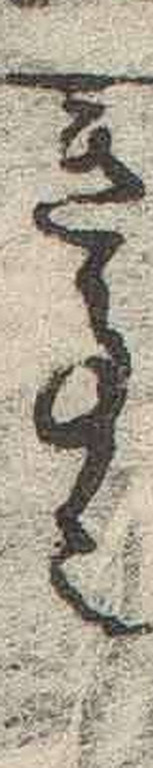き事也
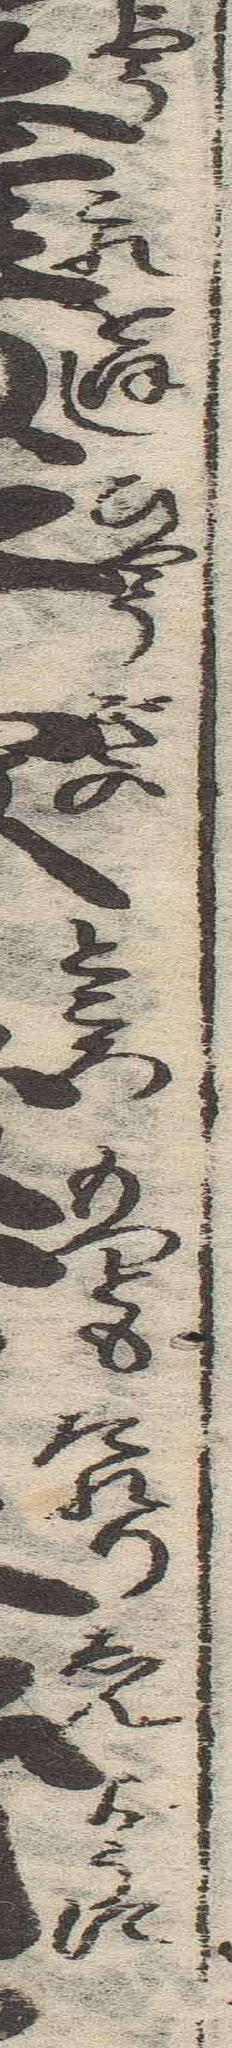じやうこれをほしひやうぎのところもつともたれりしんように
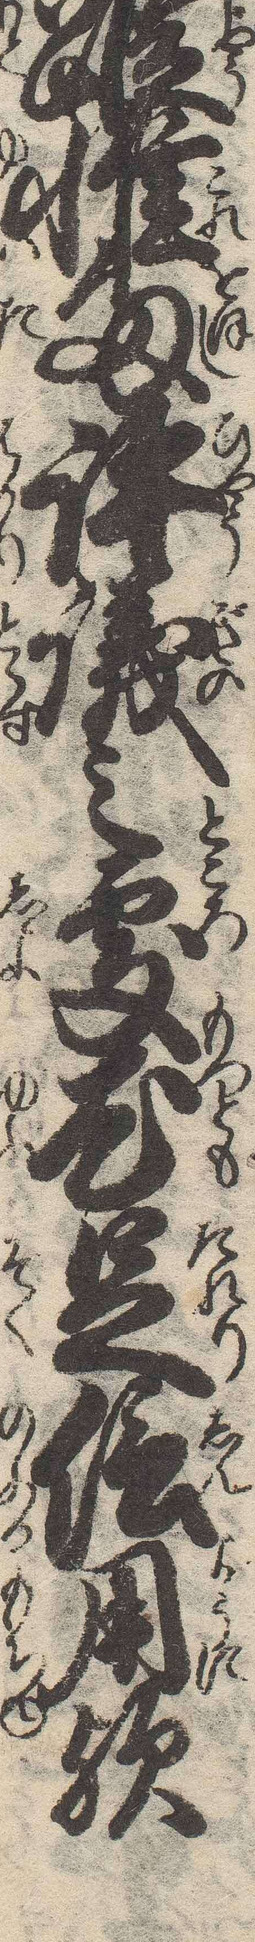蹤惟多評議之處尤足信用欤
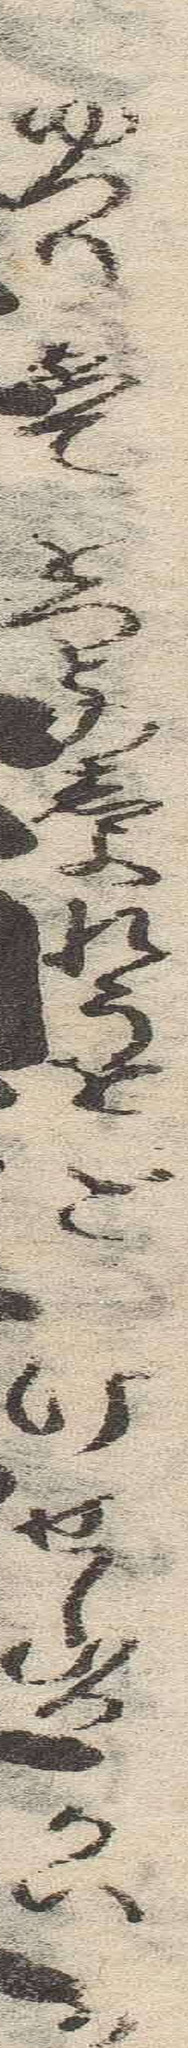ゆつりゑてをつとのしよれうをごけせしむるかいか
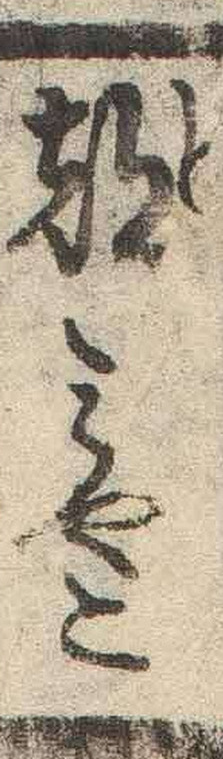都みやこ
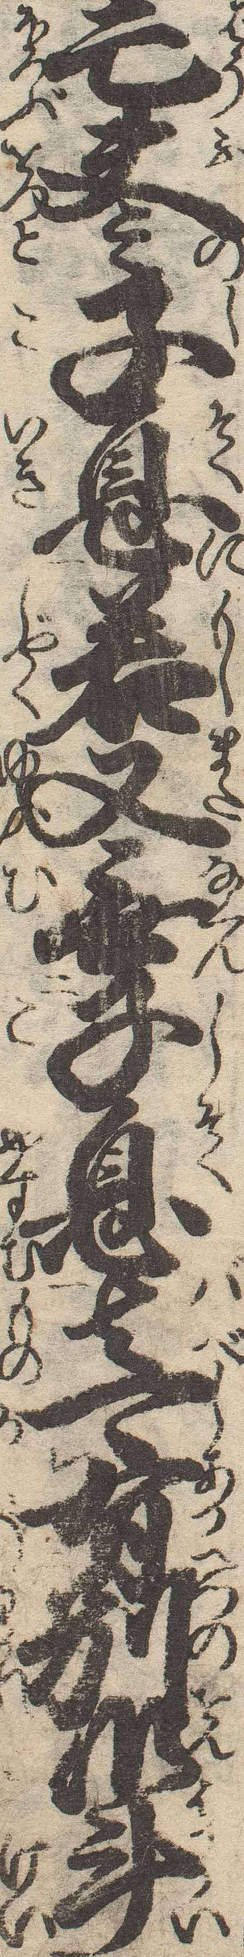亡夫之子息若又無子息者可有別御計
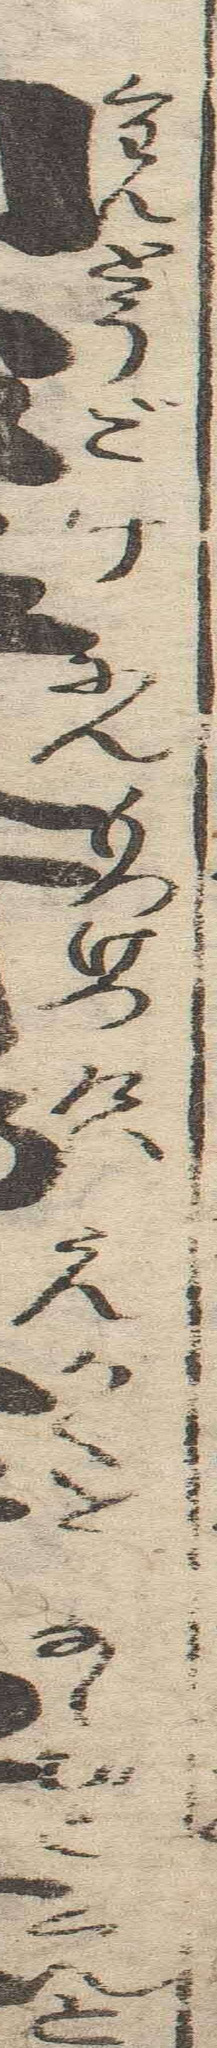くわんとうごけにんもつけつけへうんかくをなしむこくんと
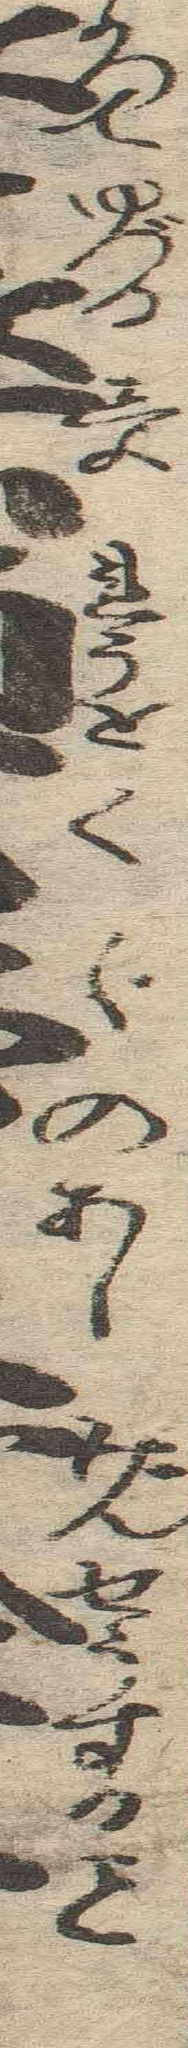よつてゆづるしよれうをくじのあしげんせうすのこと
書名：御成敗式目絵抄
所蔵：東京学芸大学附属図書館 国文学研究資料館
